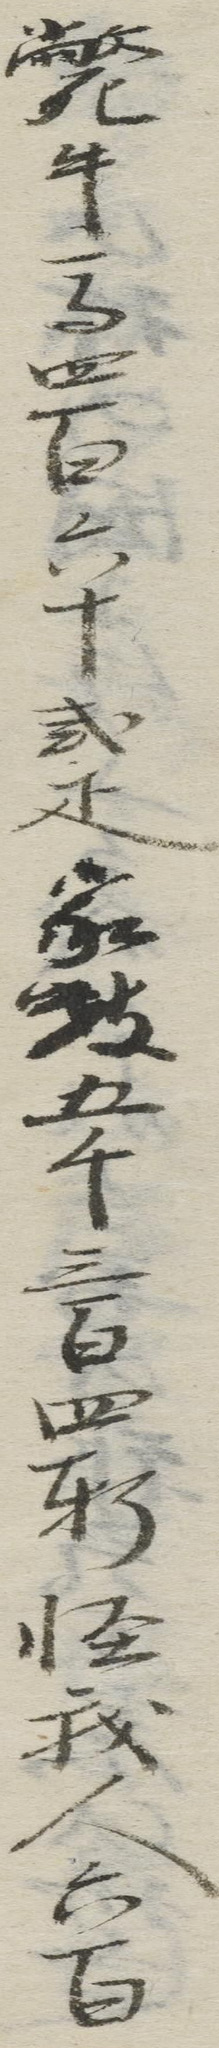斃牛馬四百六十弐疋家敷五千三百四軒怪我人六百
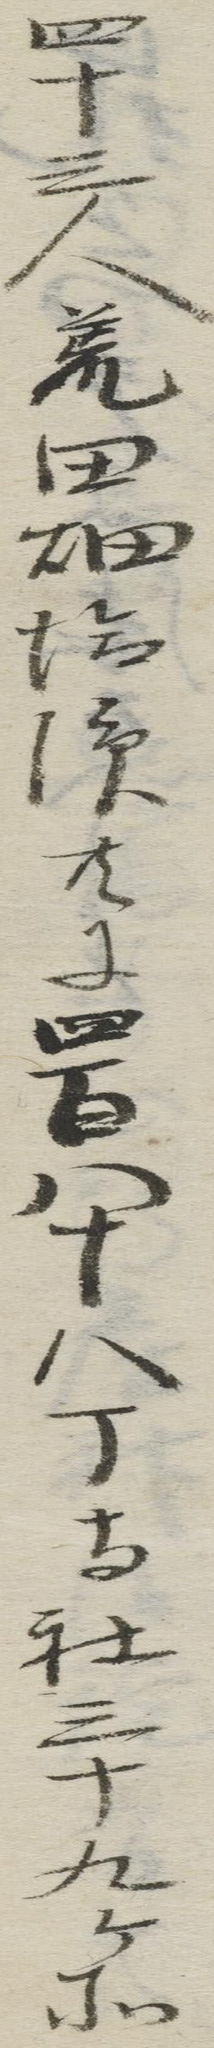四十三人荒田畑塩漬共に四百八十八丁寺社三十九ケ所
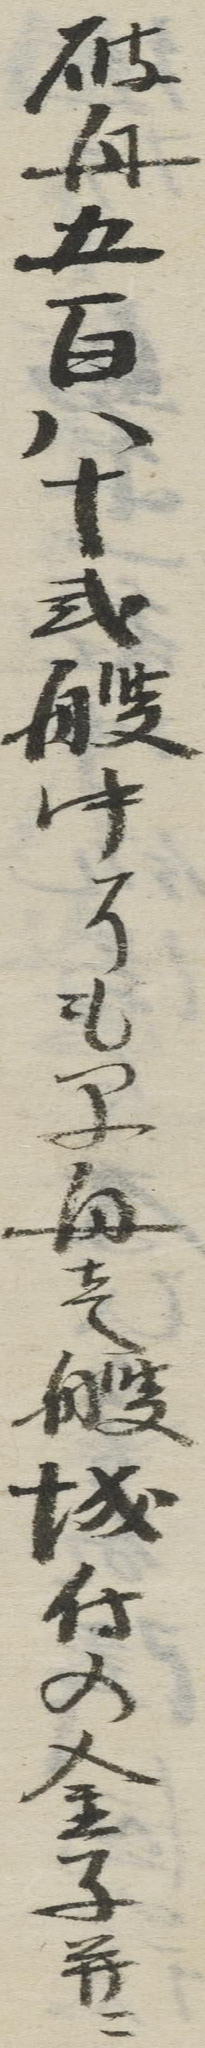破舟五百八十弐艘中にも早舟壱艘城付の金子并に
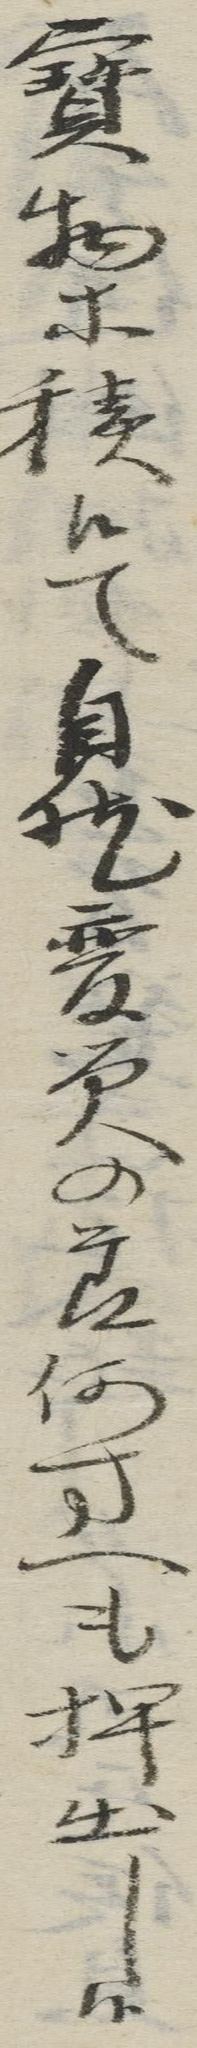寶物等積候て自然変災の節何方へも押出し候
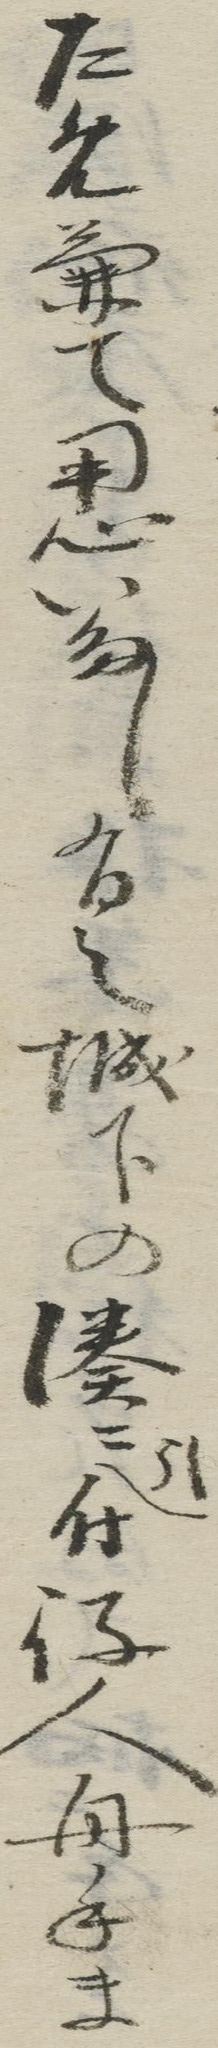ため兼て用心いたし有之城下の湊に引付役人舟手ま
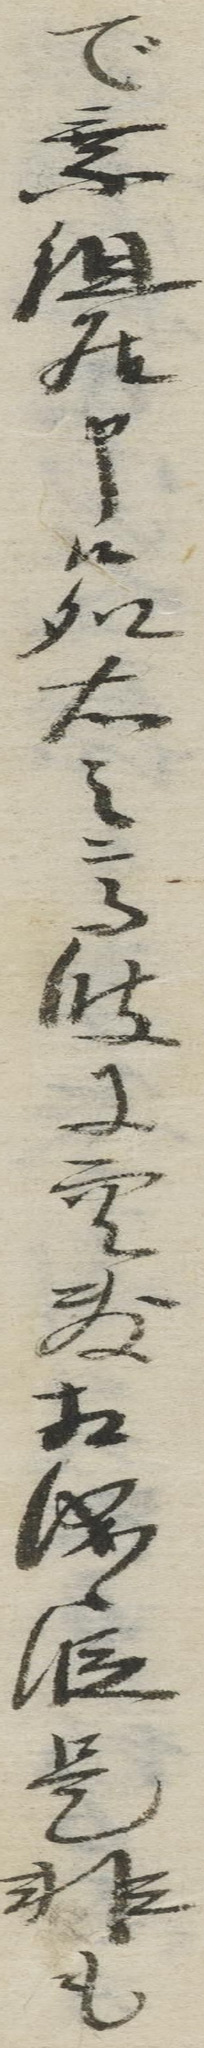で乗組居申候処右之高波に空敷相洩れ候段是非も
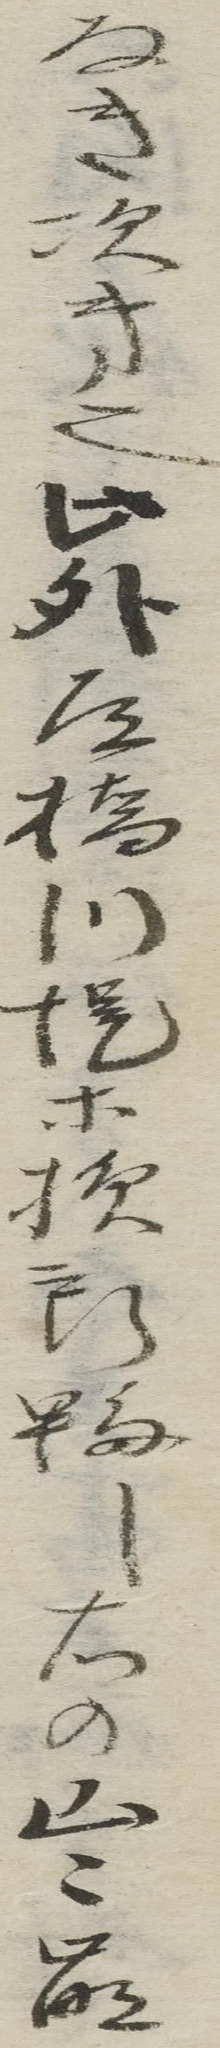なき次第也此外道橋川堤等損所夥し右の山〻崩
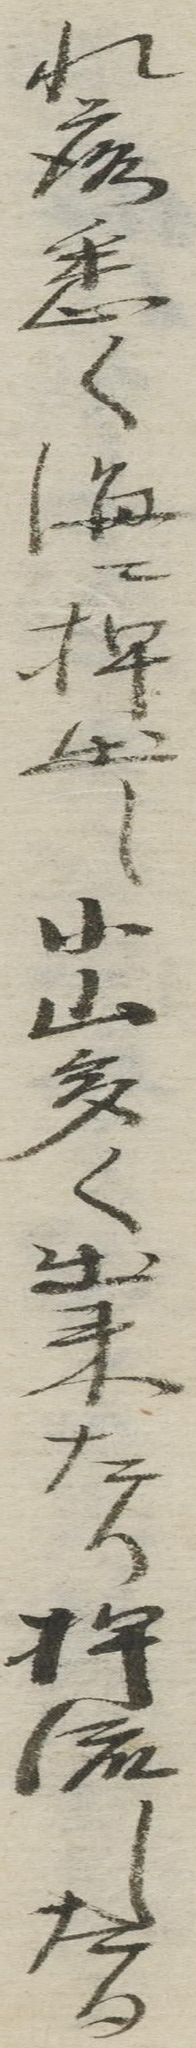れ落悉く海に押出し小山多く出来たり押流したる
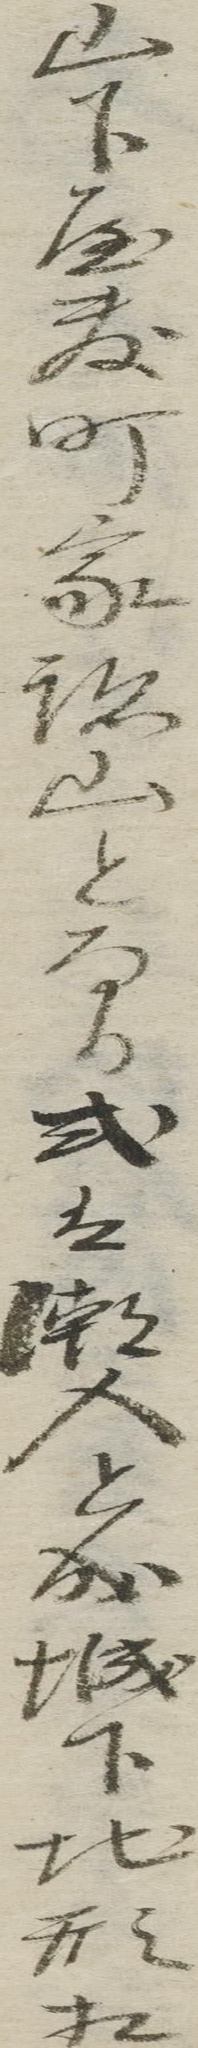山下屋敷町家跡山となり或は潮人と成城下地形相
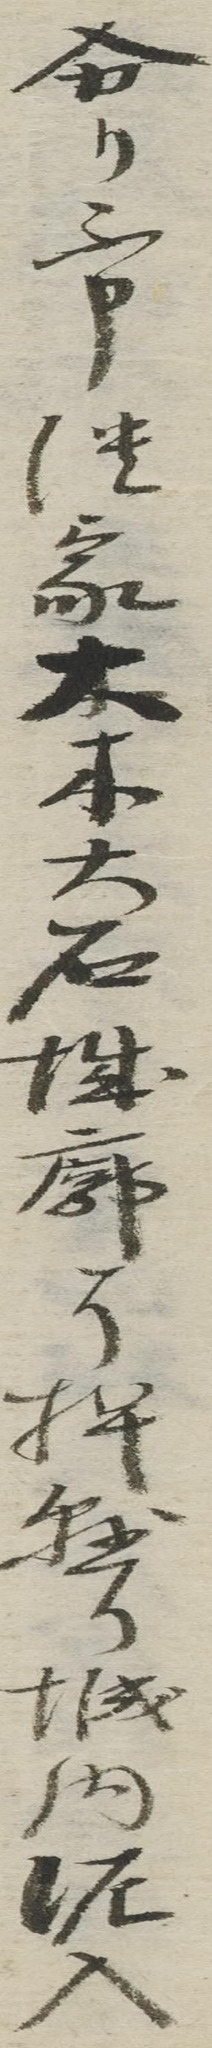分り不申潰家大木大石城郭に押懸り城内泥入
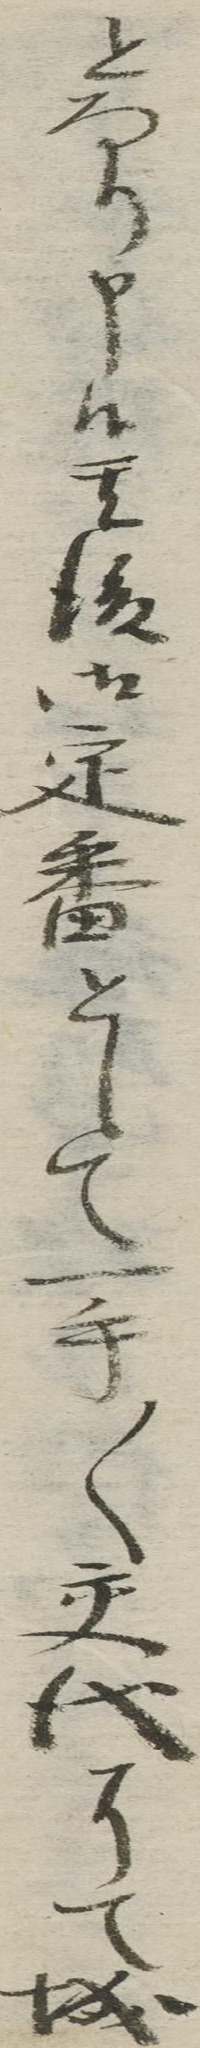となり申候其後御定番として一手〳〵交代にて城
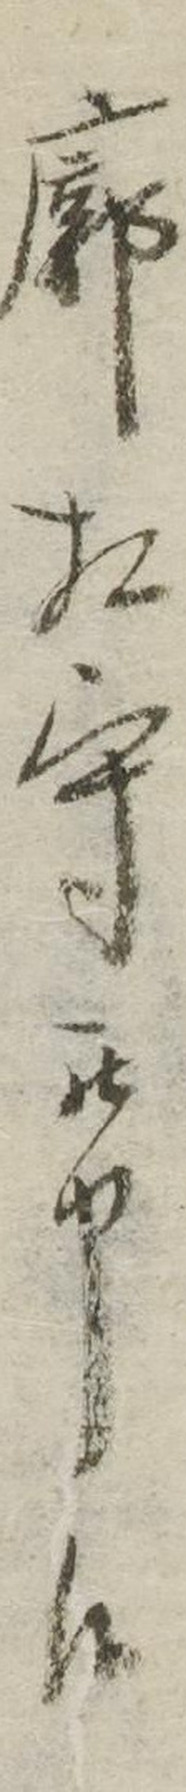郭相守被申候
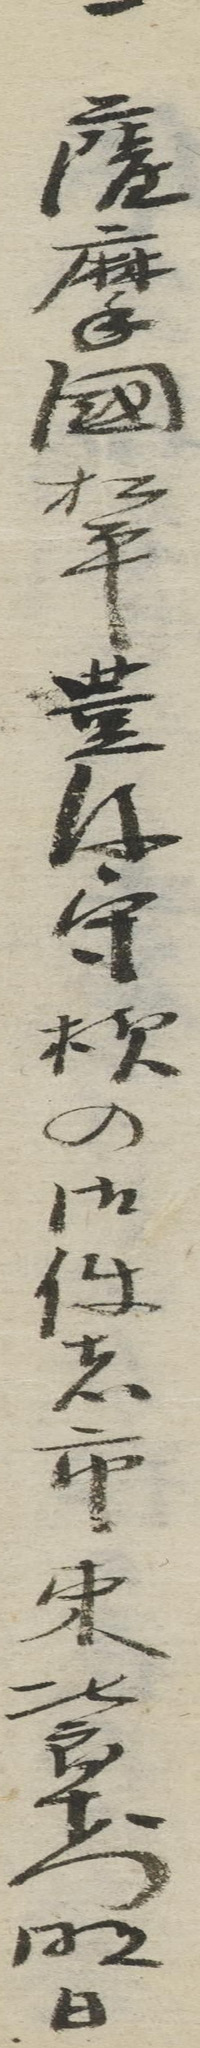一薩摩國松平豊後守様の御使者市東次郎衛門明日

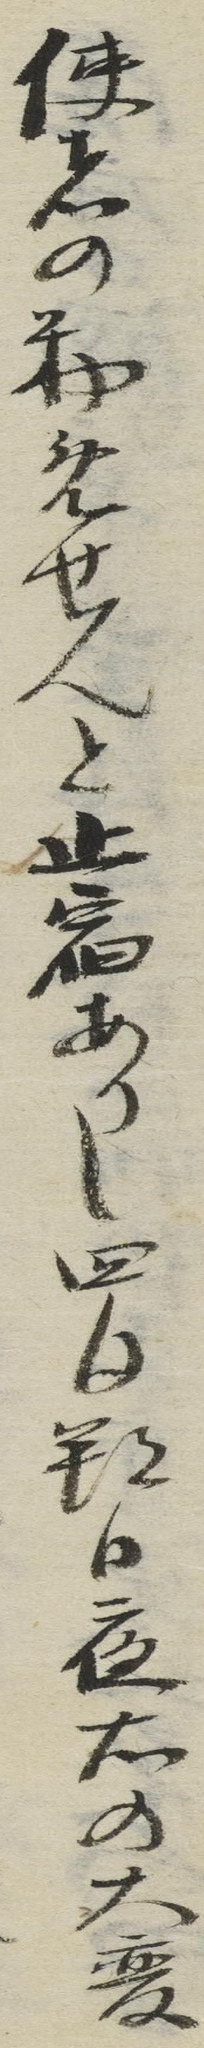使者の勤めせんと止宿ありし四月朔日夜右の大変
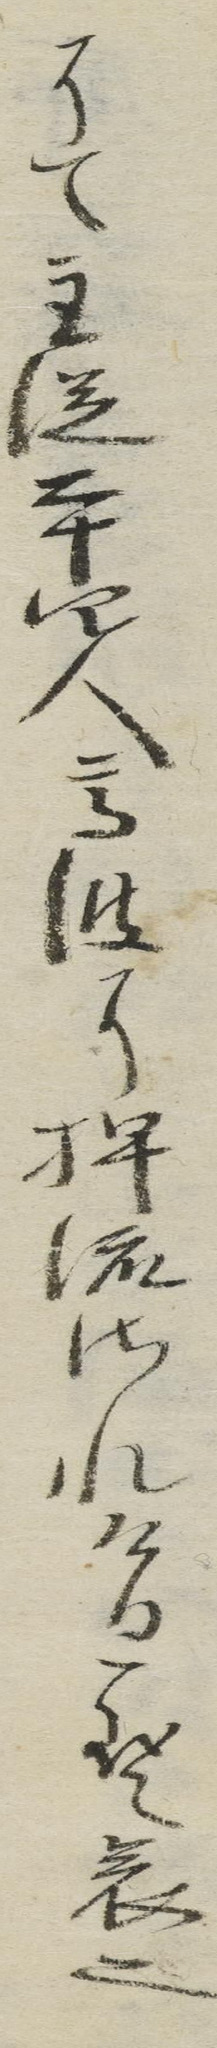にて主従二十四人高波に押流されけるこそ哀也
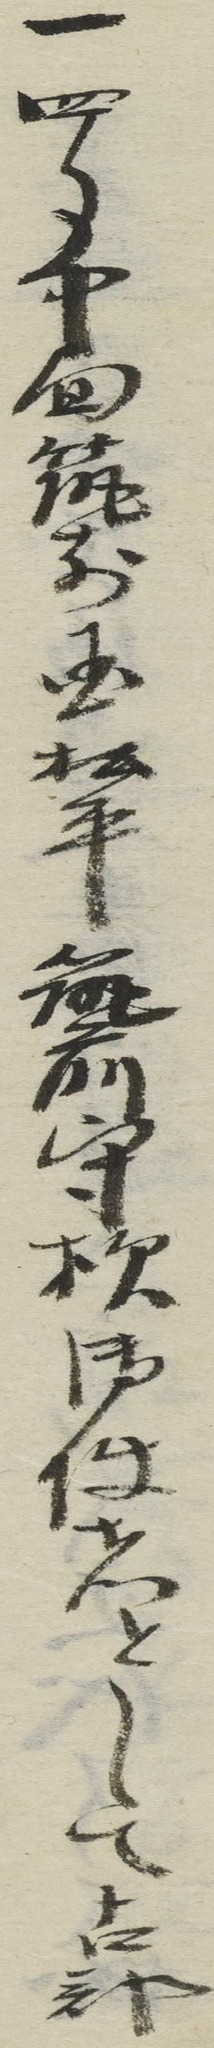一四月中旬筑前國松平筑前守様御使者として占部
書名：肥前國島原領普賢山大変記　完
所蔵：東京大学地震研究所図書室 Earthquake Research Institute Library, The University of Tokyo, JAPAN
